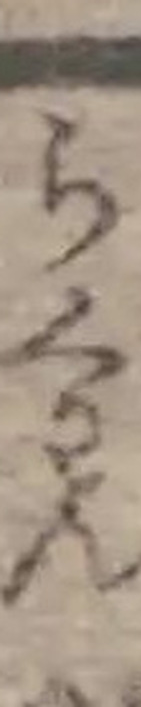らくわん
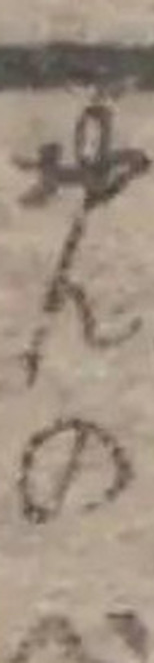おんの
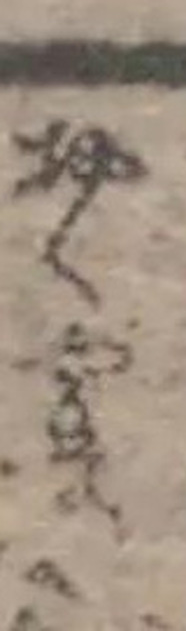おくやま
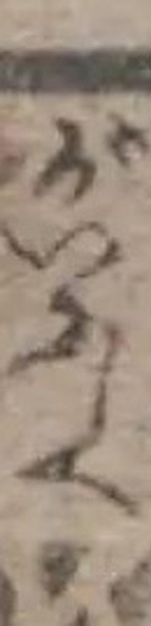がいにしへ
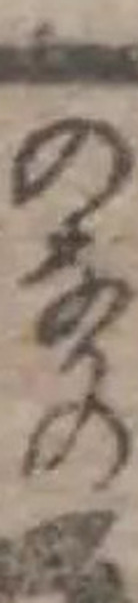のなかの
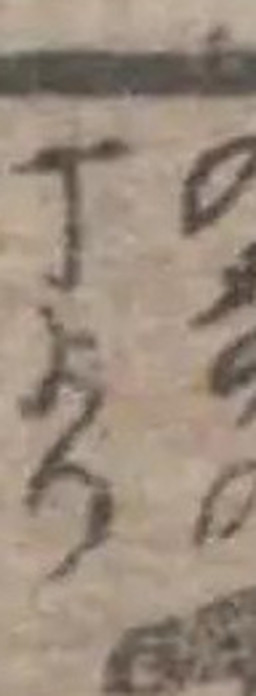丁より
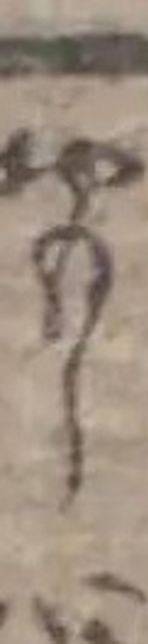おもし
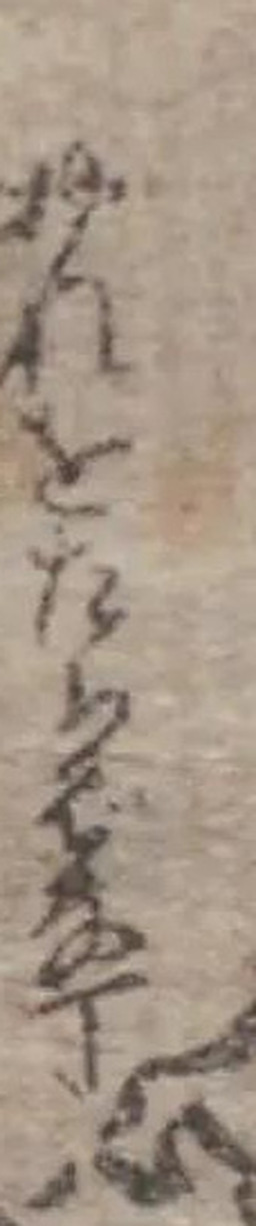おれをたちばな丁
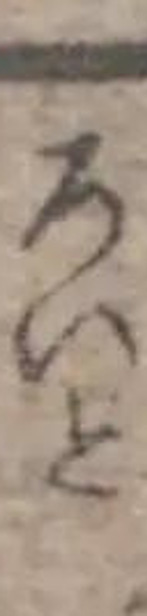ろいと
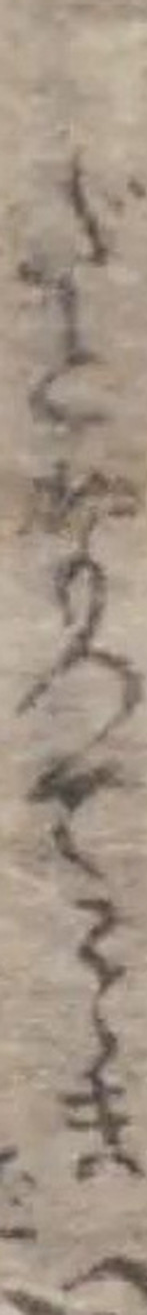だとおもつてこゝまで
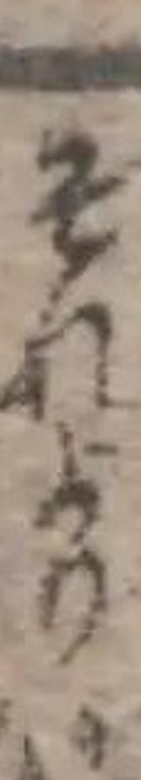それより
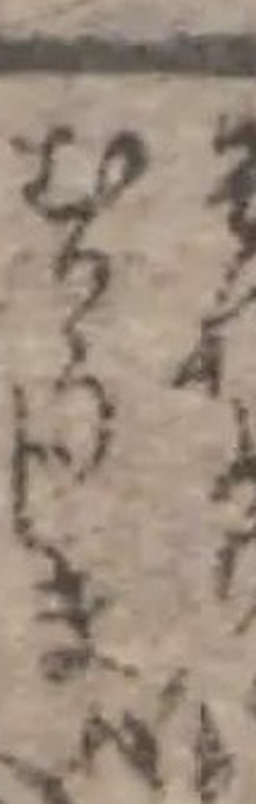むかうじま
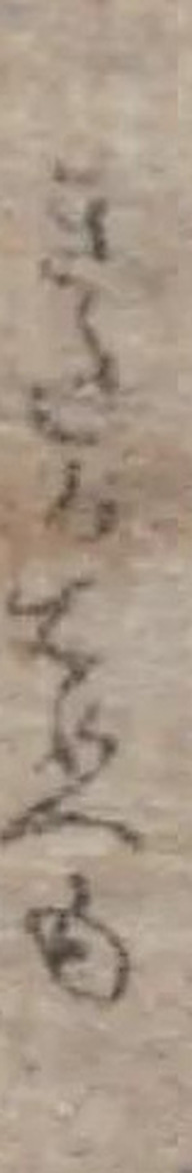きたかてめへも
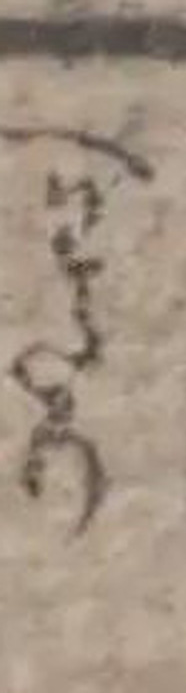へわたり
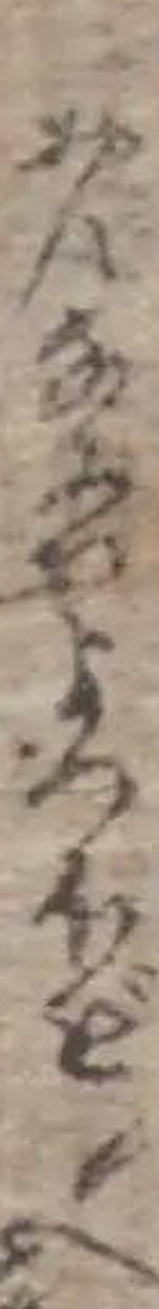おんなにはよつほど
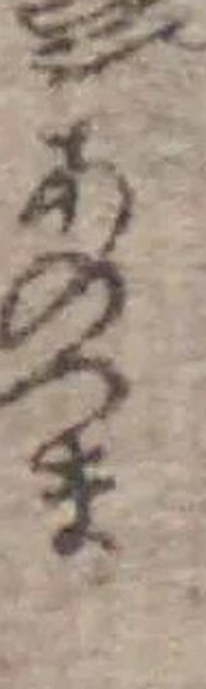あのつま
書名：富多高慢噺 3巻
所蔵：国立国会図書館 National Diet Library, JAPAN
